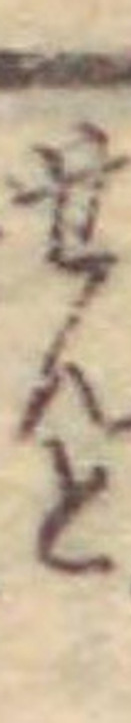せんと
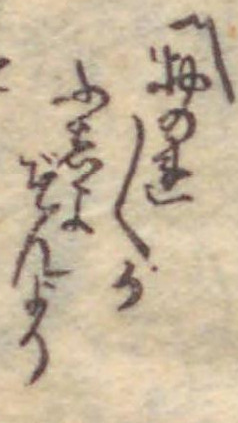ふしよ
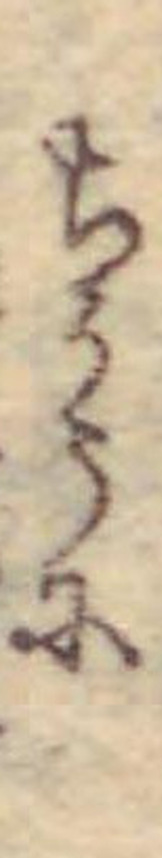ちううに
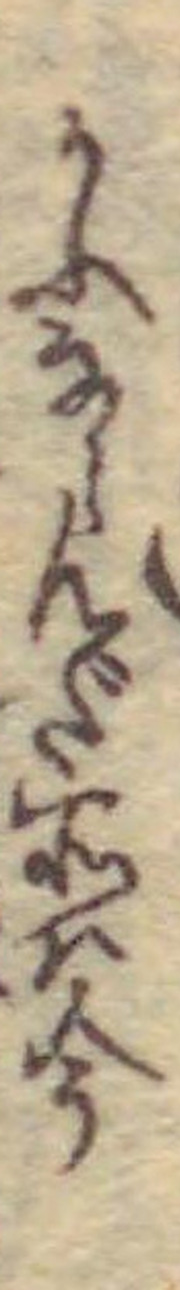かふならんだ所は今
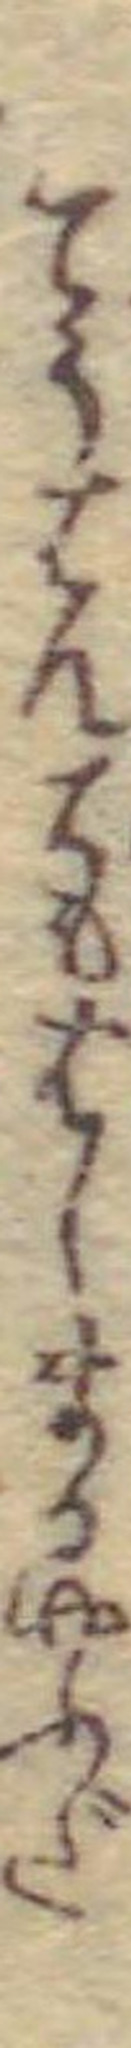てうはんてもはしまるやふだ
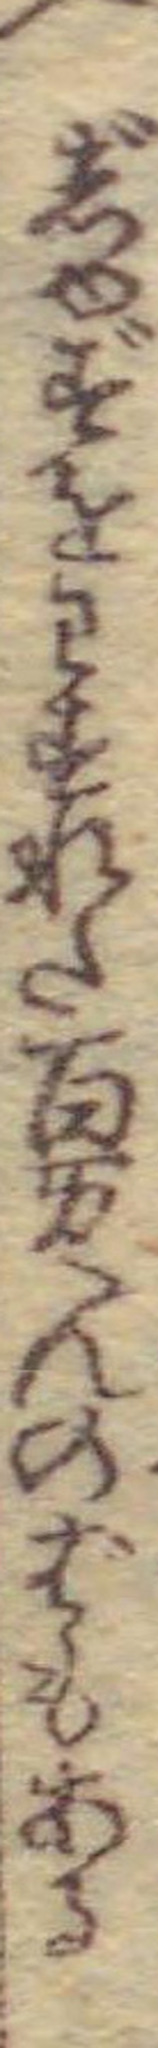じゆずをわすれた百万べんのばもある

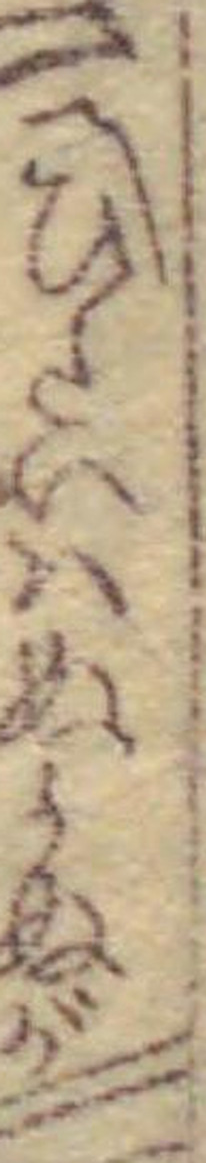〽ひたいはぬかぬが
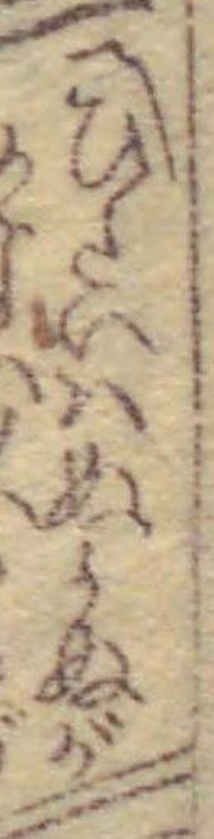〽ひたいはぬかぬが
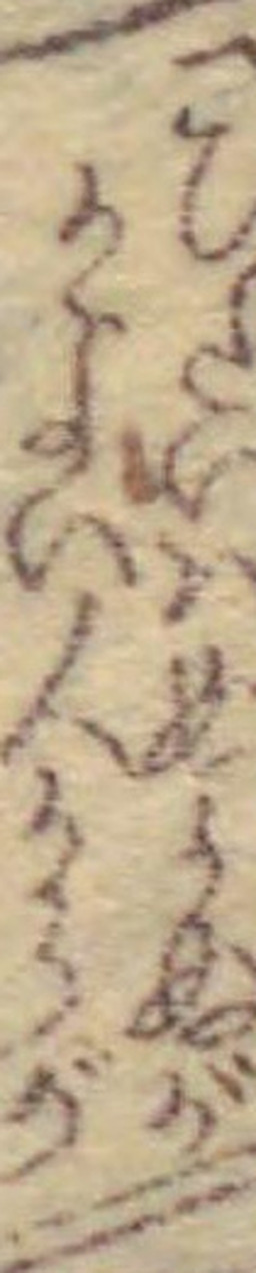かよい人からが
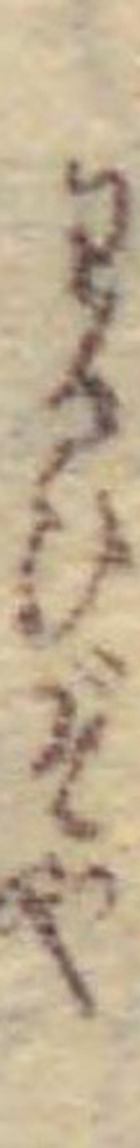わるひぞや
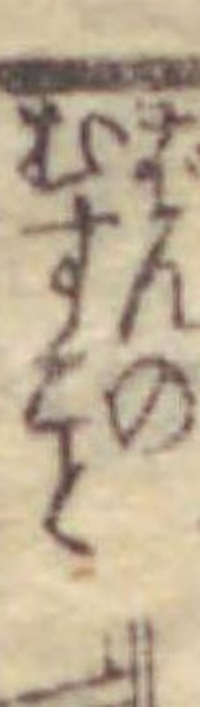むすこと
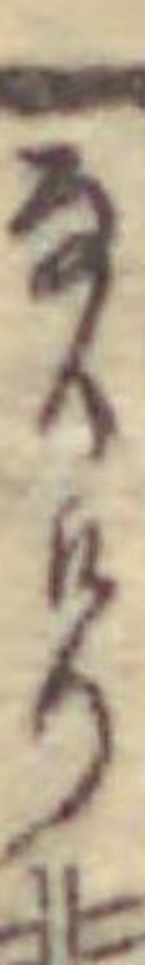なりけり
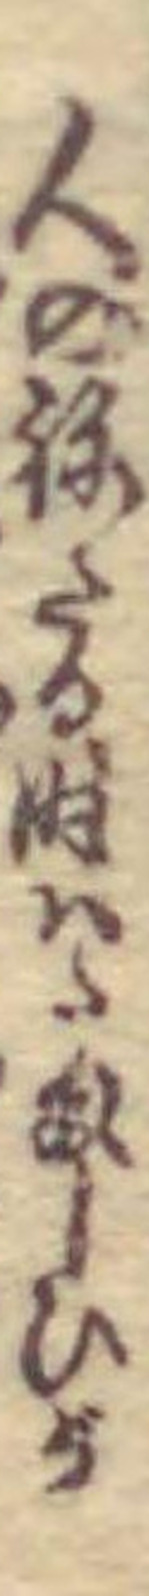人のねたる時はたましひが
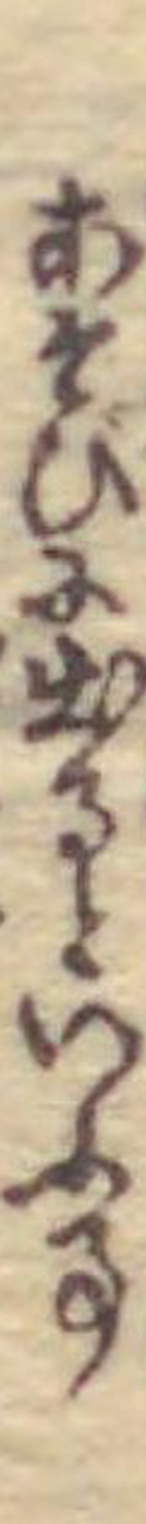あそびに出るといふ事
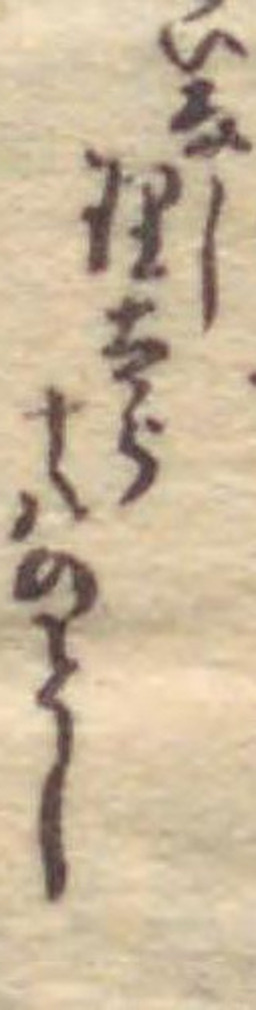十八のとし
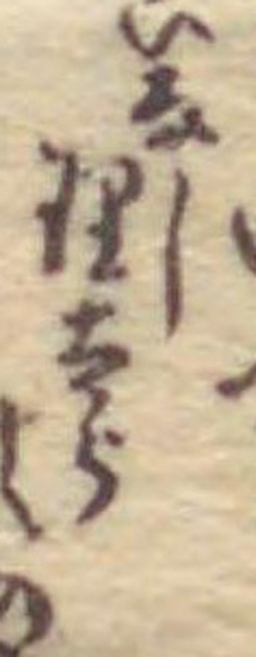理太郎
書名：心学早染艸 : 3巻
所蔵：国立国会図書館 National Diet Library, JAPAN
